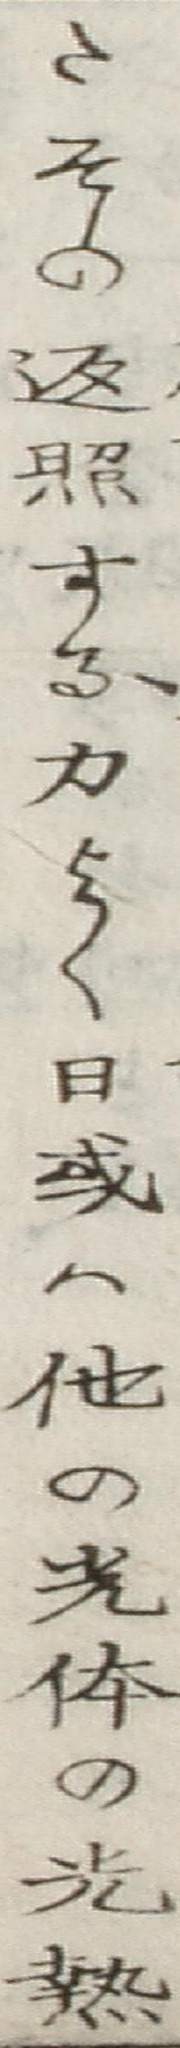たその返照する、力よく日或は他の光体の光熱
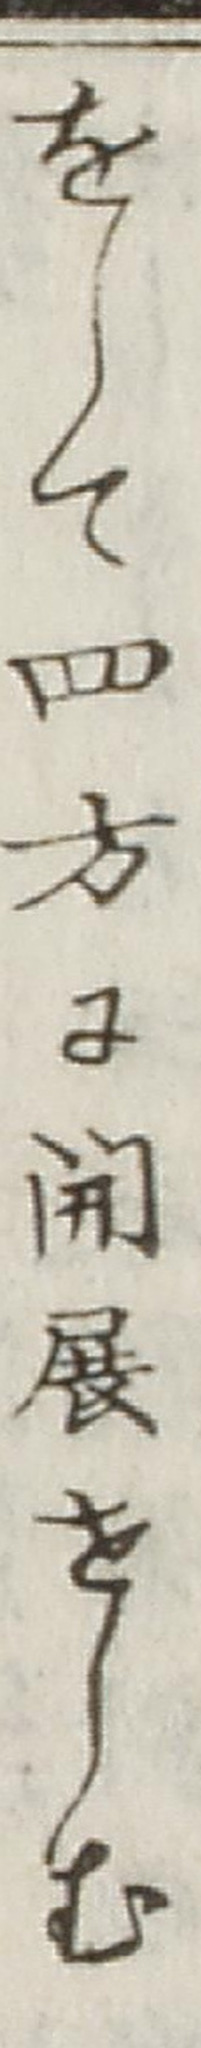をして四方に開展せしむ
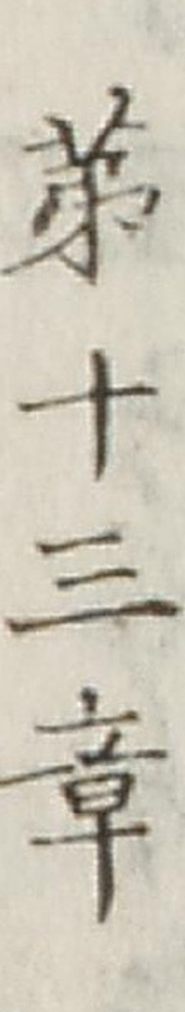第十三章
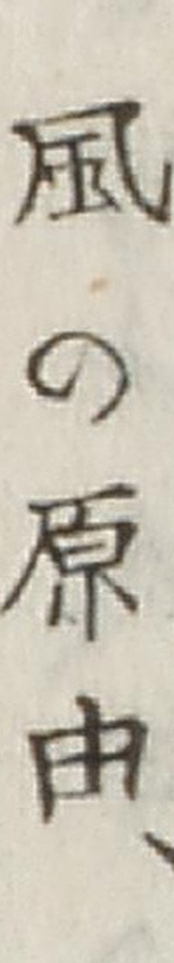風の原由、
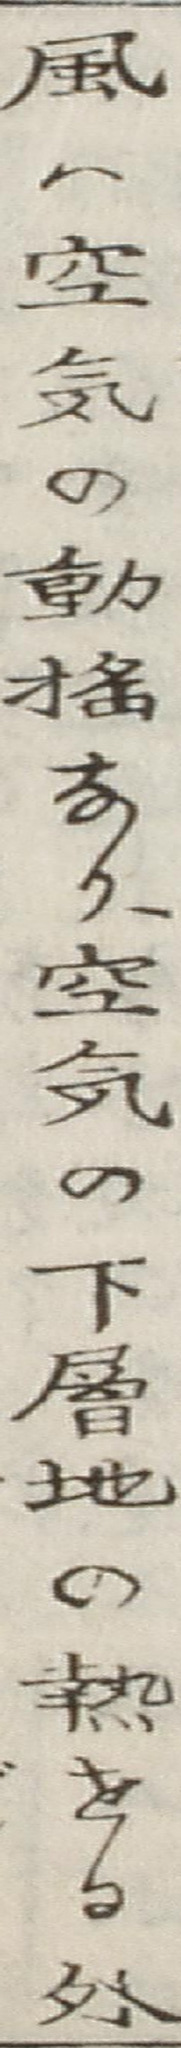風は空気の動揺なり、空気の下層地の熱せる外
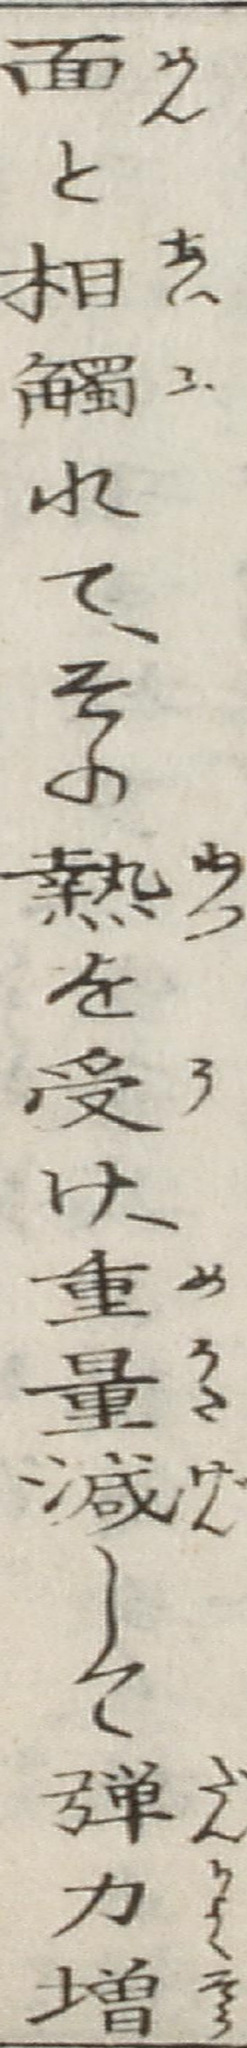面と相触れて、その熱を受け、重量減して弾力増
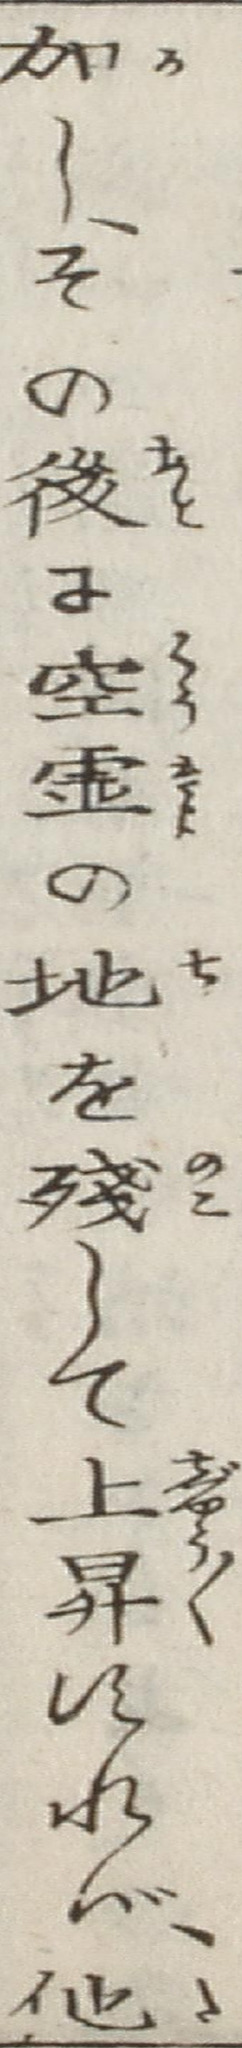加し、その後に空虚の地を残して上昇すれば、他
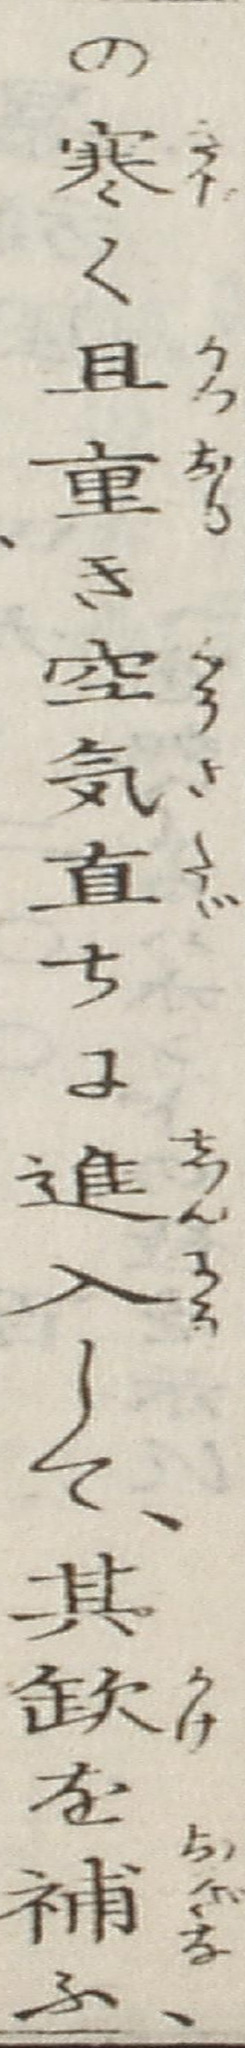の寒く且重き空気直ちに進入して、其欫を補ふ、
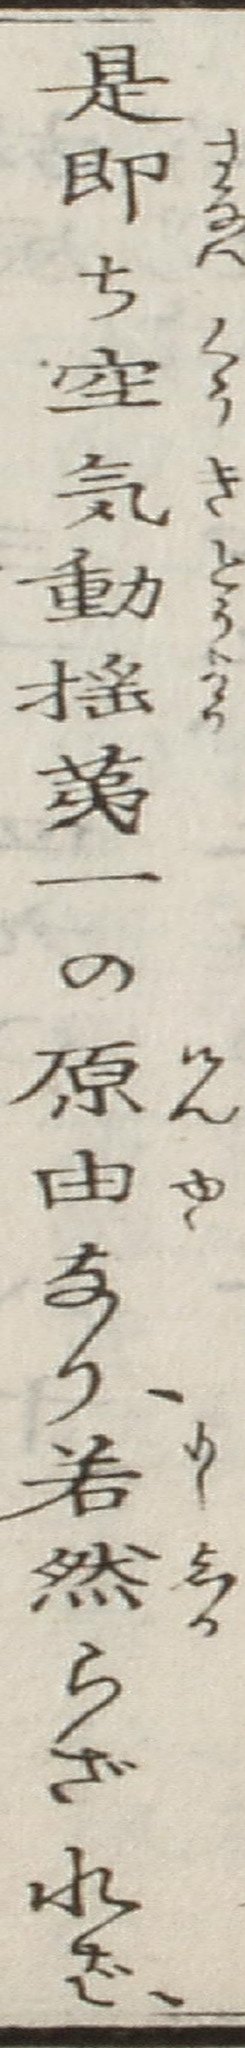是即ち空気動揺第一の原由なり、若然らざれば、
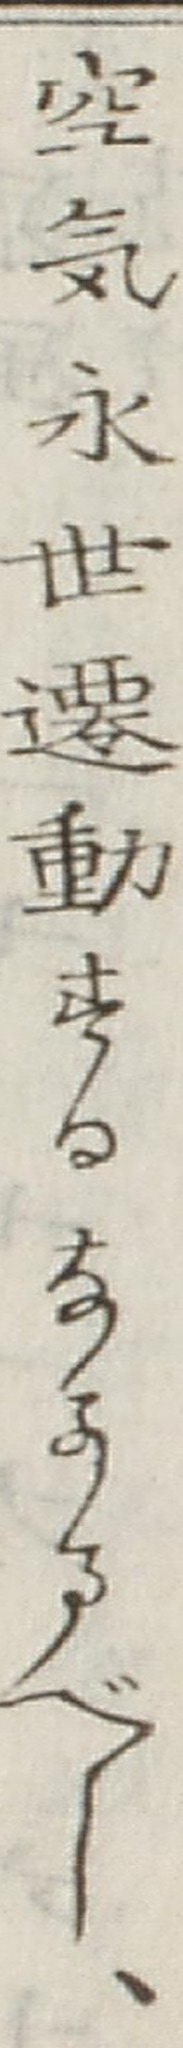空気永世遷動するなかるべし、
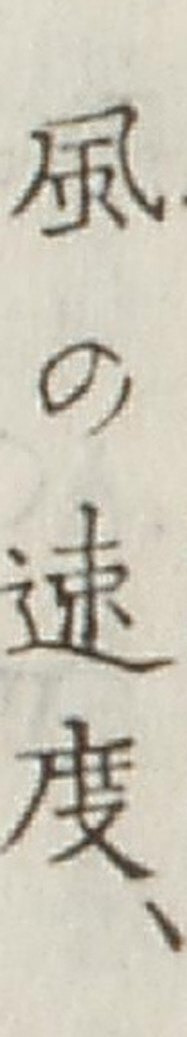風の速度、
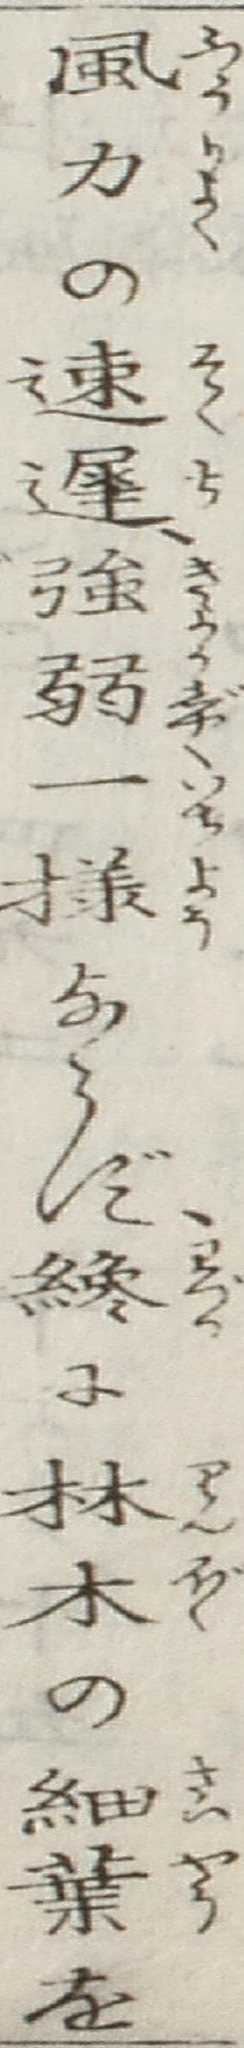風力の速遅、強弱一様ならず、僅に林木の細葉を
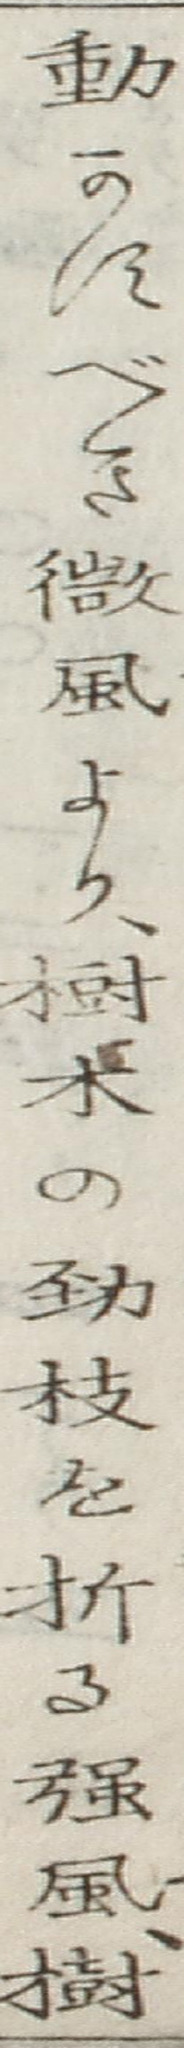動かすべき微風より、樹木の頚枝を折る強風、樹
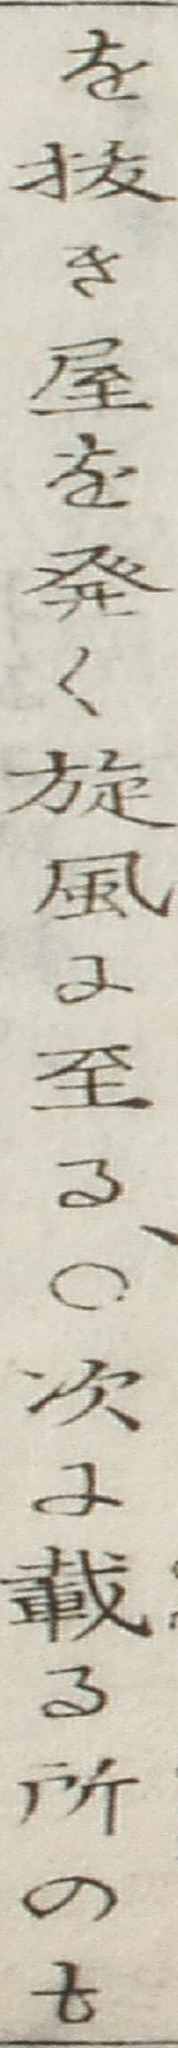を抜き屋を発く旋風に至る、○次に載る所のも
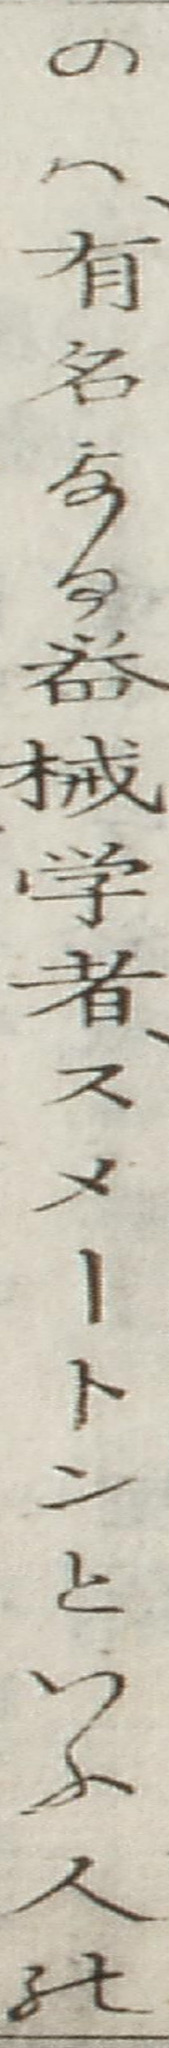のは、有名なる器械学者、スメートンといふ人の
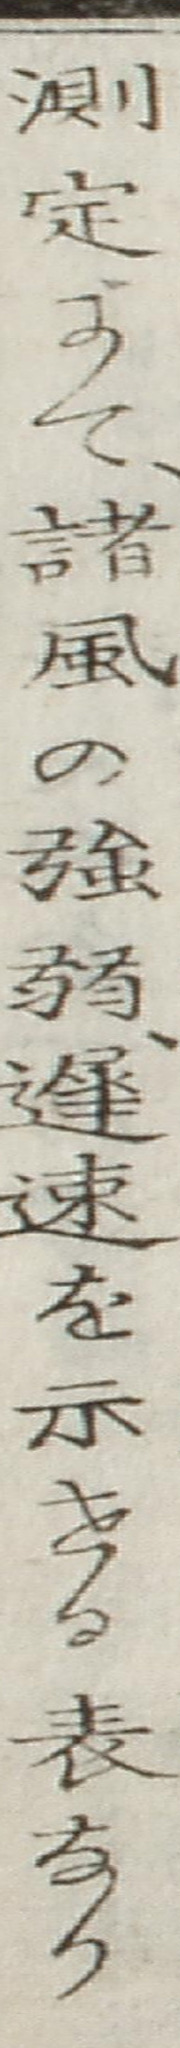測定にて、諸風の強弱、遅速を示せる表なり
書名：訓蒙　天然地理學　中
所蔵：東京大学地震研究所図書室 Earthquake Research Institute Library, The University of Tokyo, JAPAN
